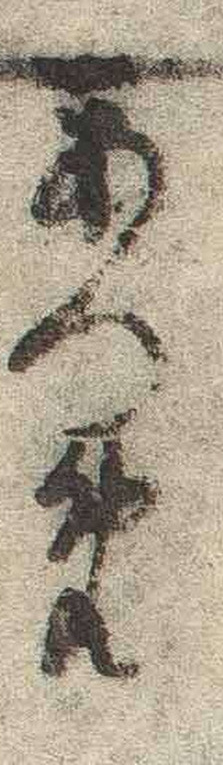あつめ
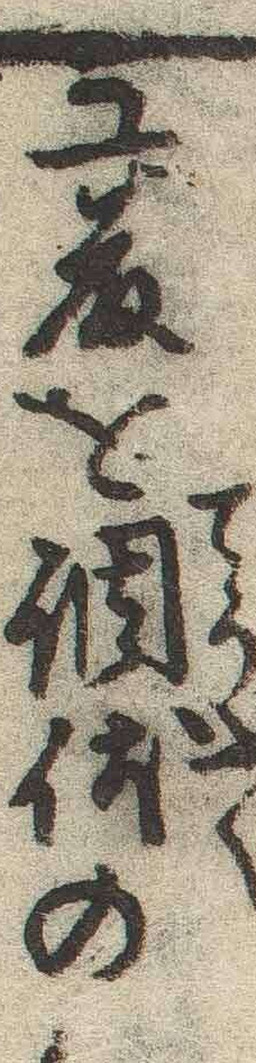工藤を調伏の
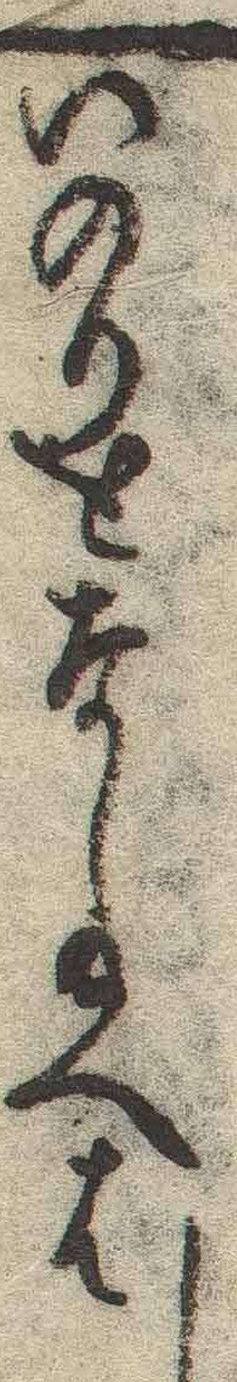いのりをなし給へは
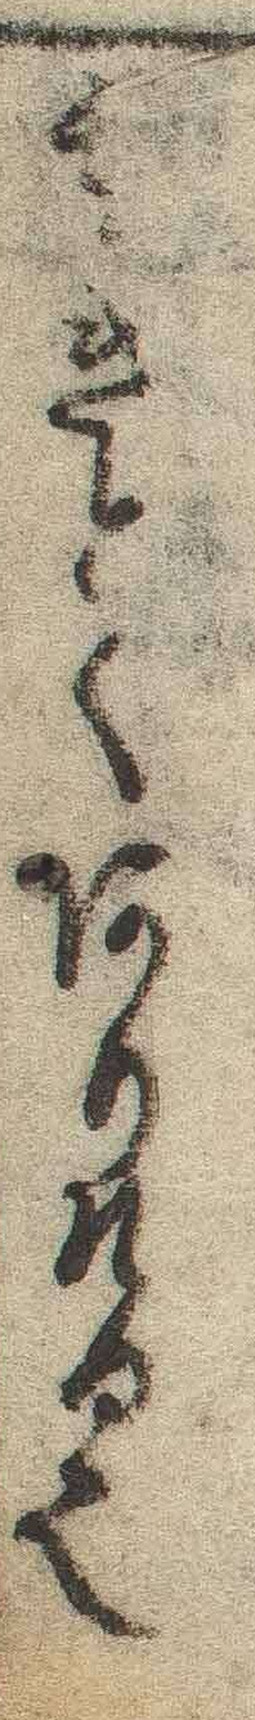其きとくありける也

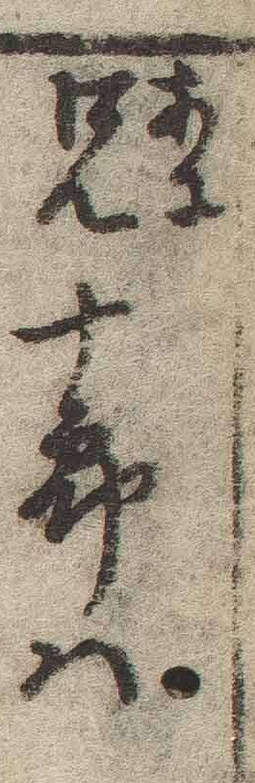兄十郎は
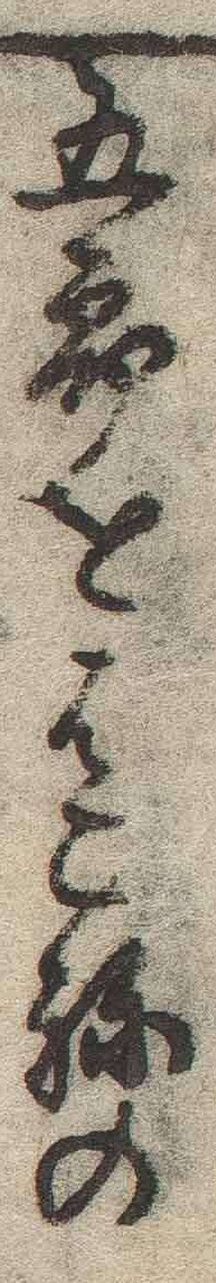五郎をはこねの
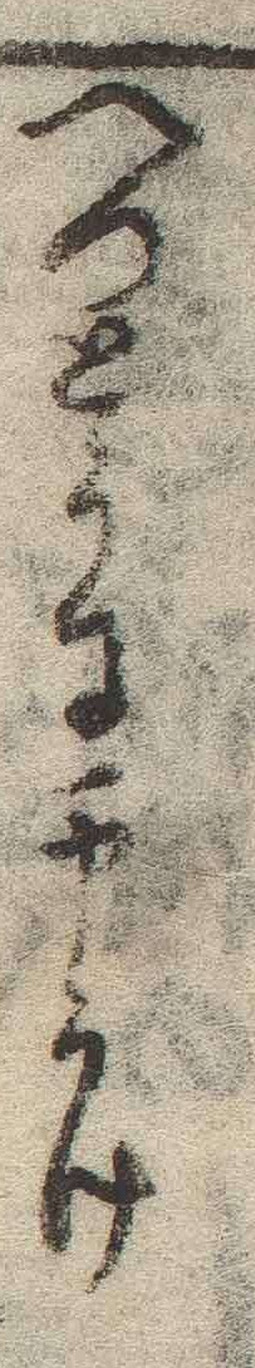へつとうにうけ
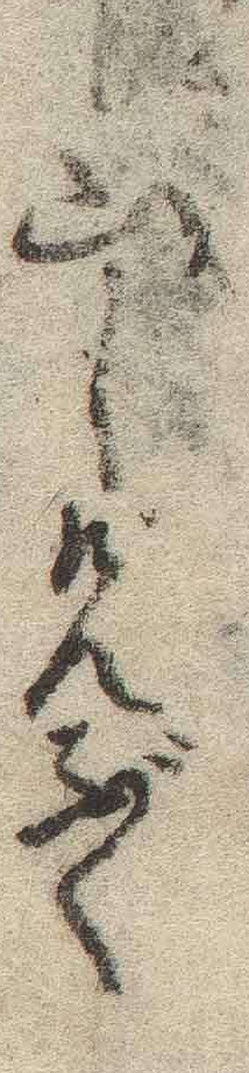下山しけんぶく
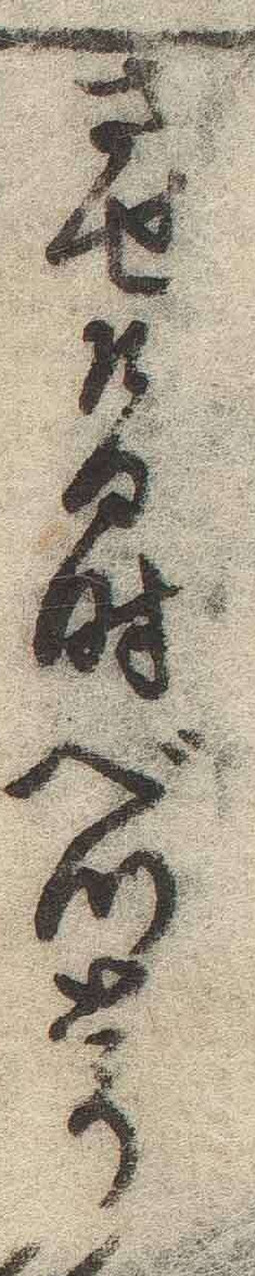させける時べつとう
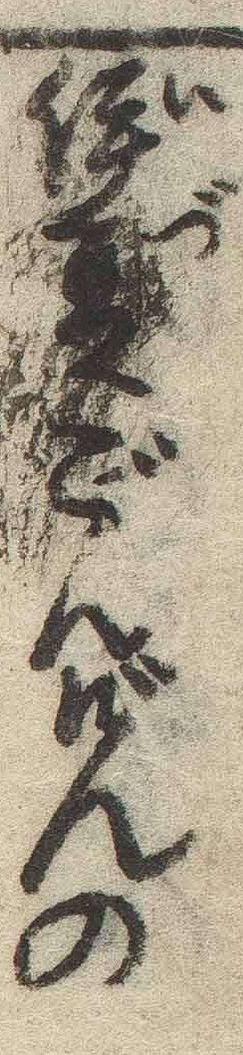伊豆ごんげんの
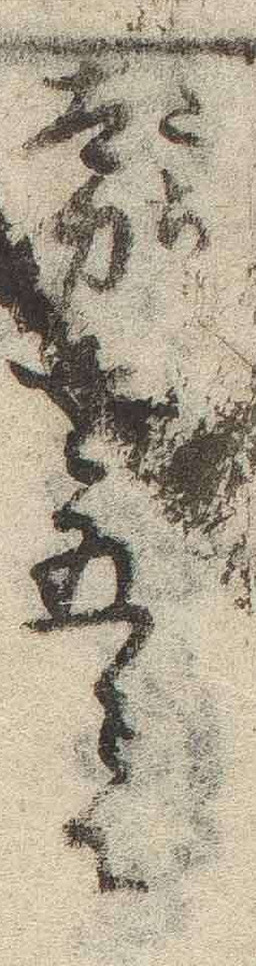太刀を五郎に
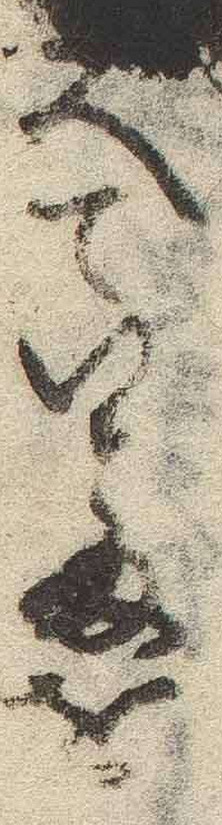へていとまを
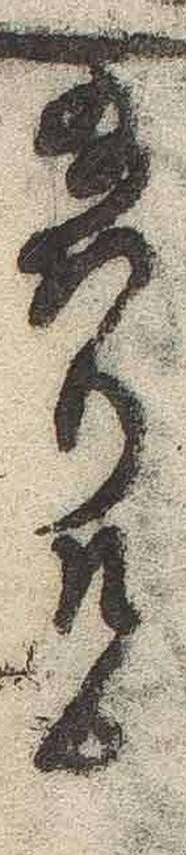給はりける
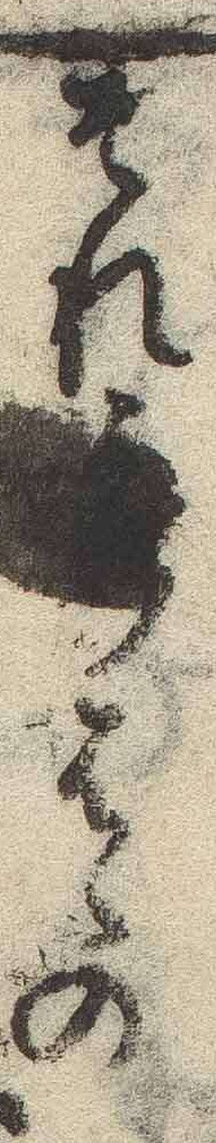それよりはゝの
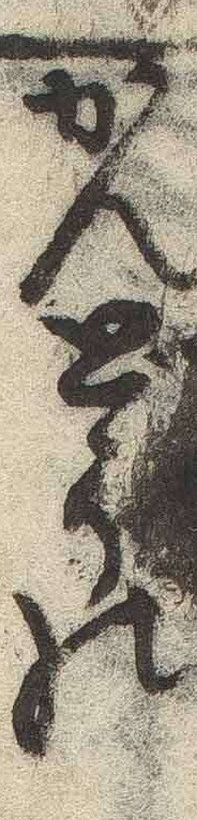かんどうの
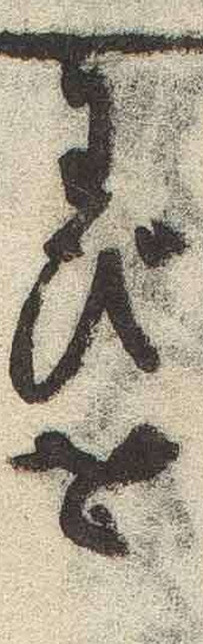わびを
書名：末広扇
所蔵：東京学芸大学附属図書館 国文学研究資料館
